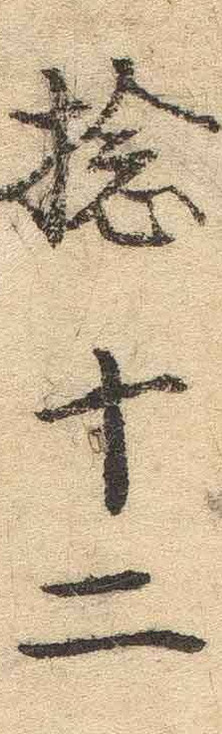捻十二
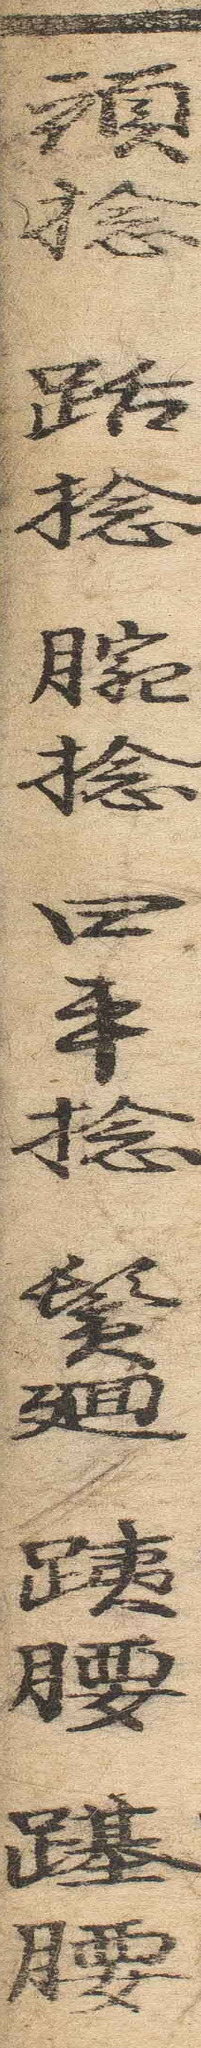頭捻䟯捻腕捻四手捻鬢廻跠腰〇腰
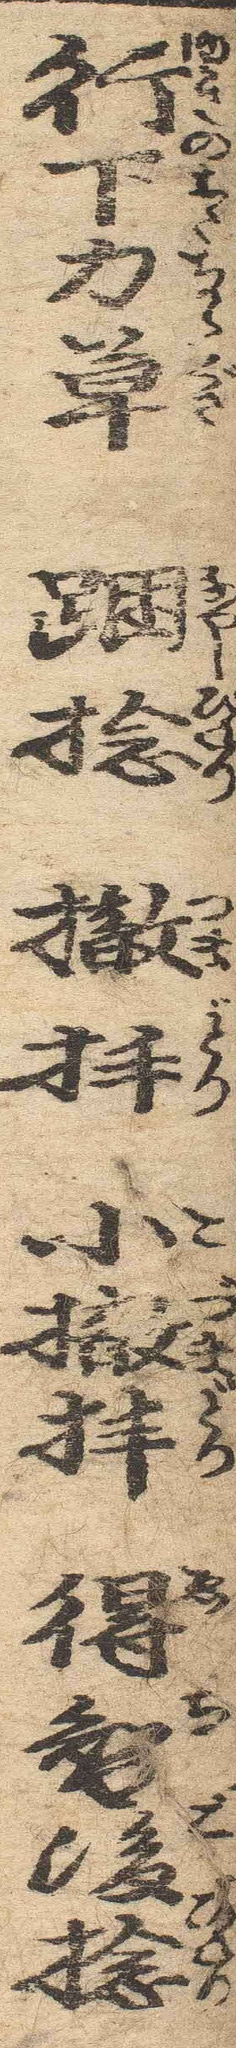行下力草䠅捻櫢拝小櫢拝得智後捻
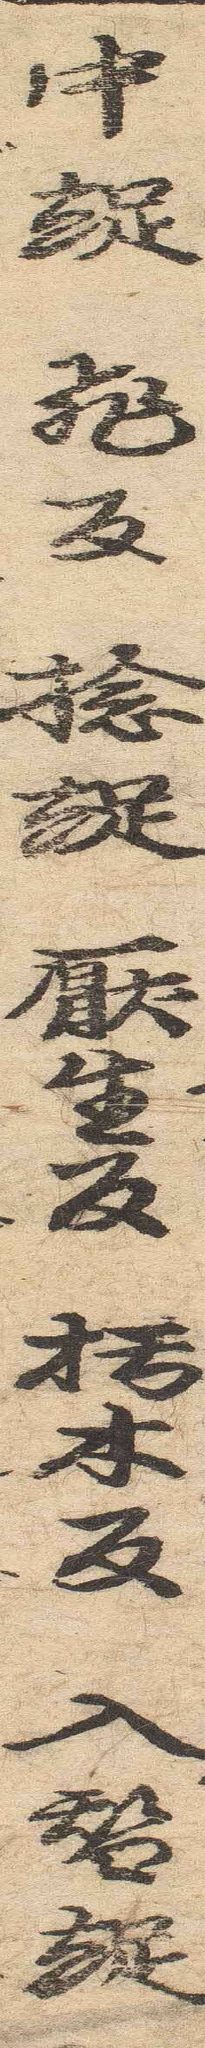中䇍飛反捻䇍厭生反朽木反入替䇍
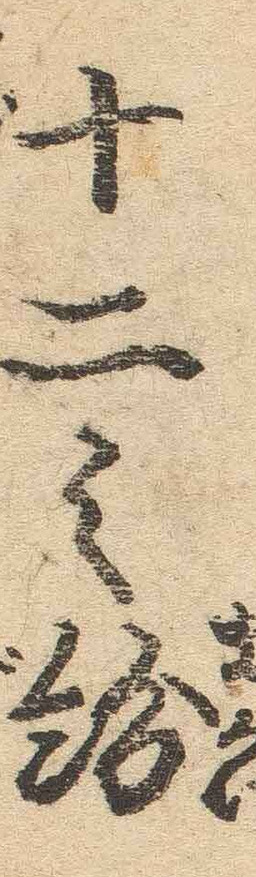十二之紛
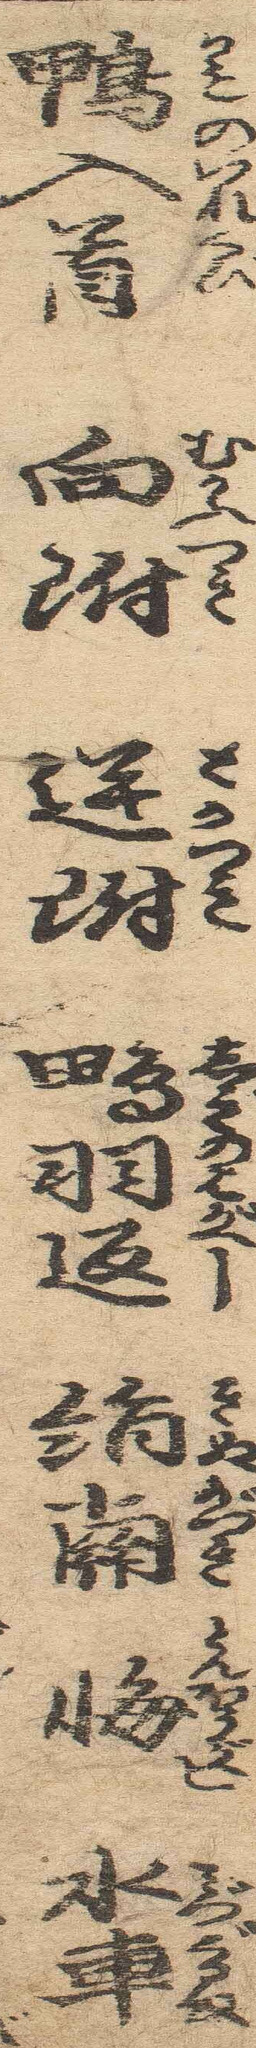鴨入首向附逆附鴫羽返絹繭悔水車
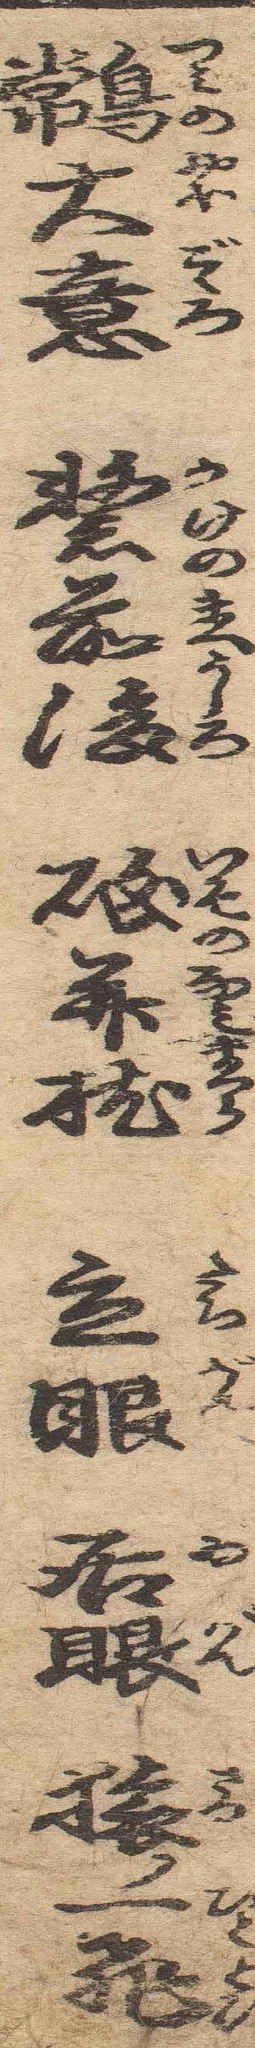〇大意繋前後磯并枕立眼居眼猿一飛

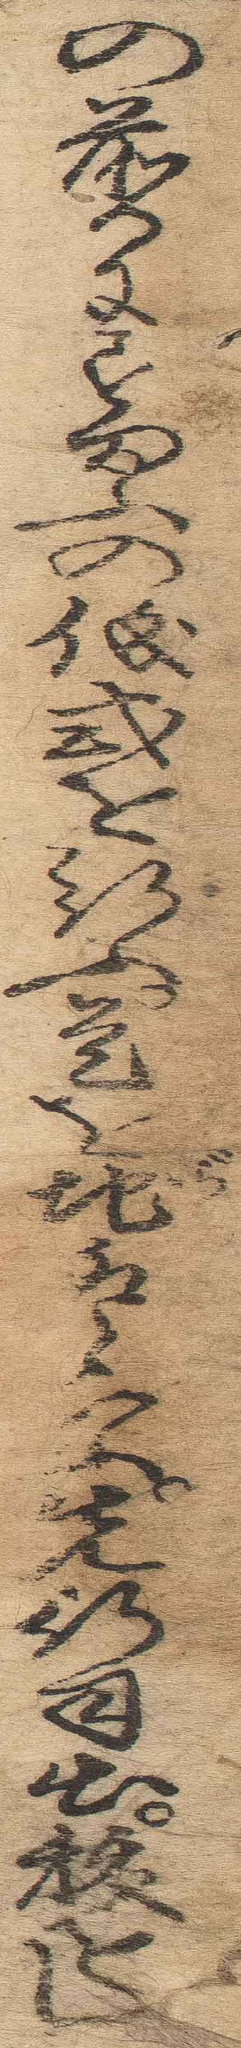の前日にすまふの儀式を行ふ。是を地取といふ。先行司出。穢をし
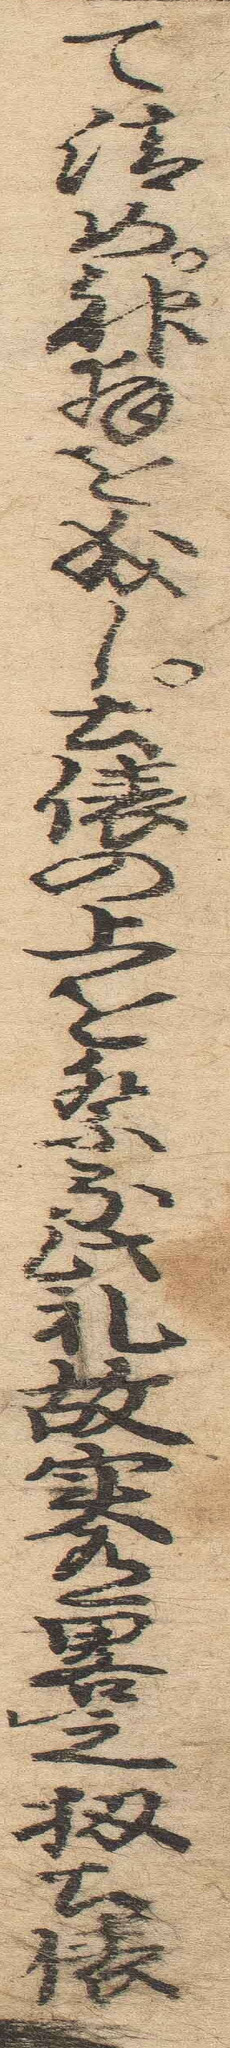て清め。神拝を成し。土俵の上を祭る此礼故実有畧之扨土俵
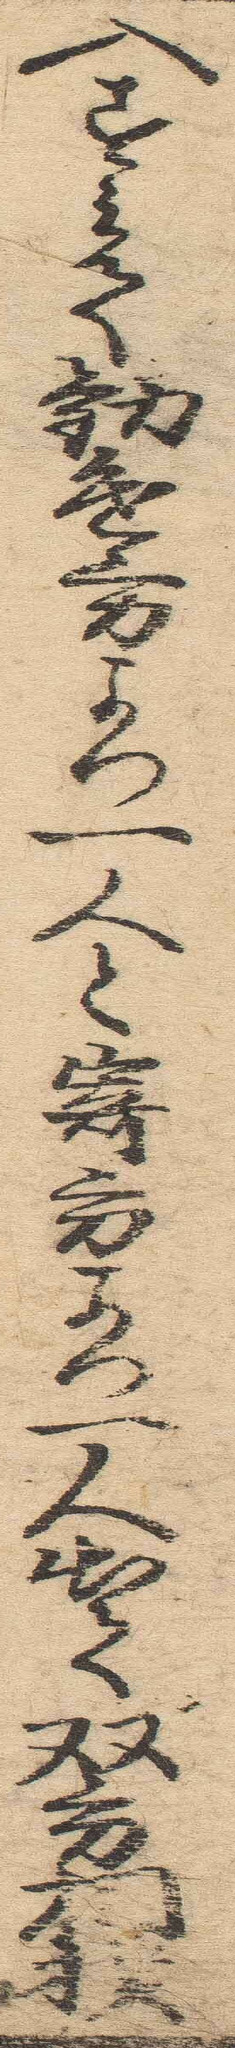入すミて勧進三方より一人と寄方より一人出て双方相撲
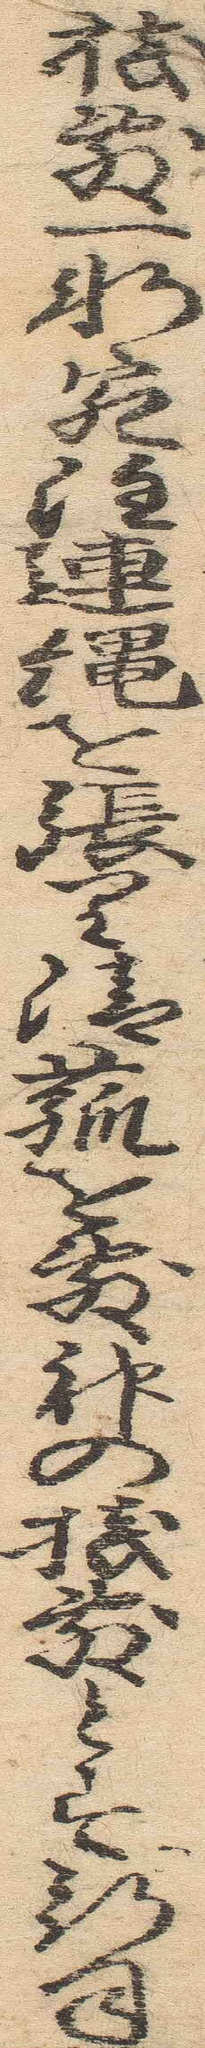桟敷一軒宛注連縄を張り清菰を敷神の桟敷とす。行司
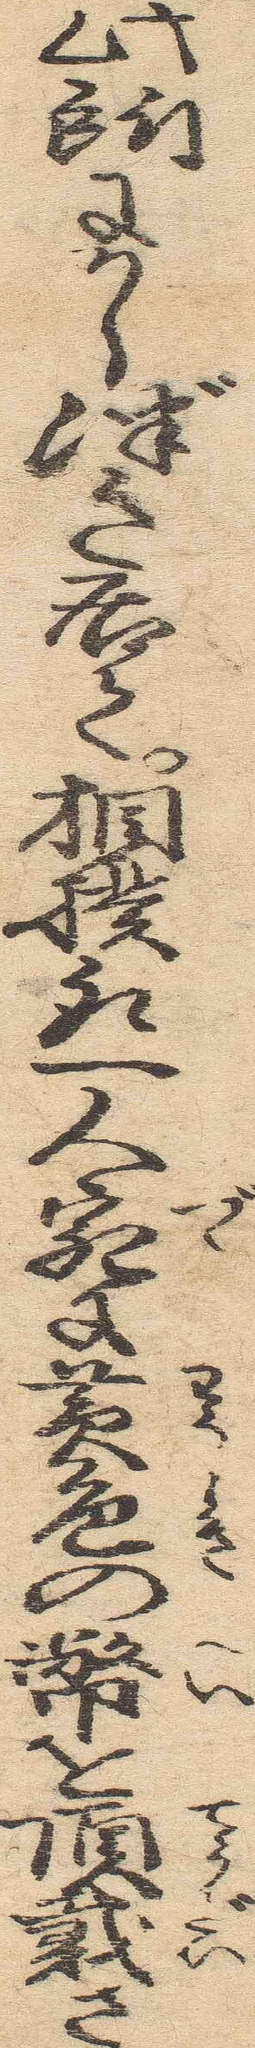此所にかしづき居て。相撲取一人宛に黄色の幣を頂戴さ
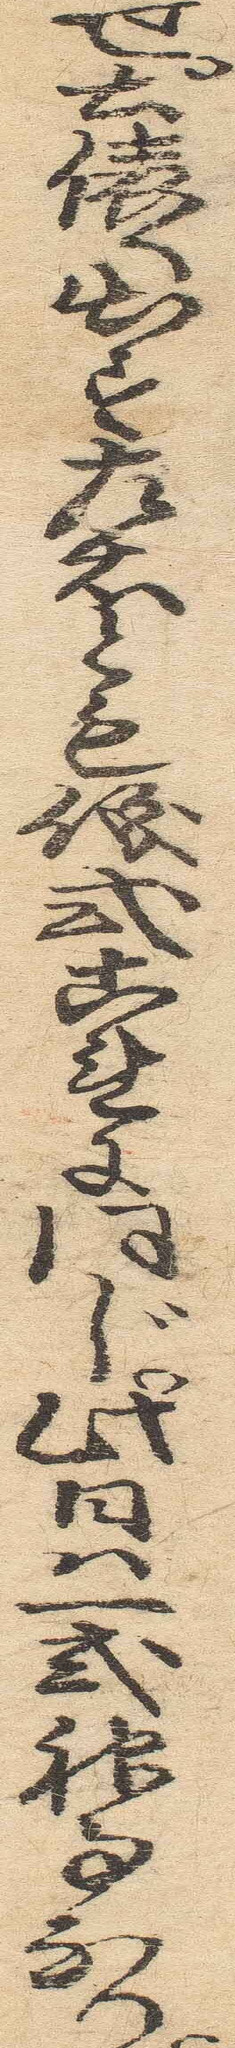せ。土俵へ出す左右とも儀式これに同じ。此日ハ一式神事なり。
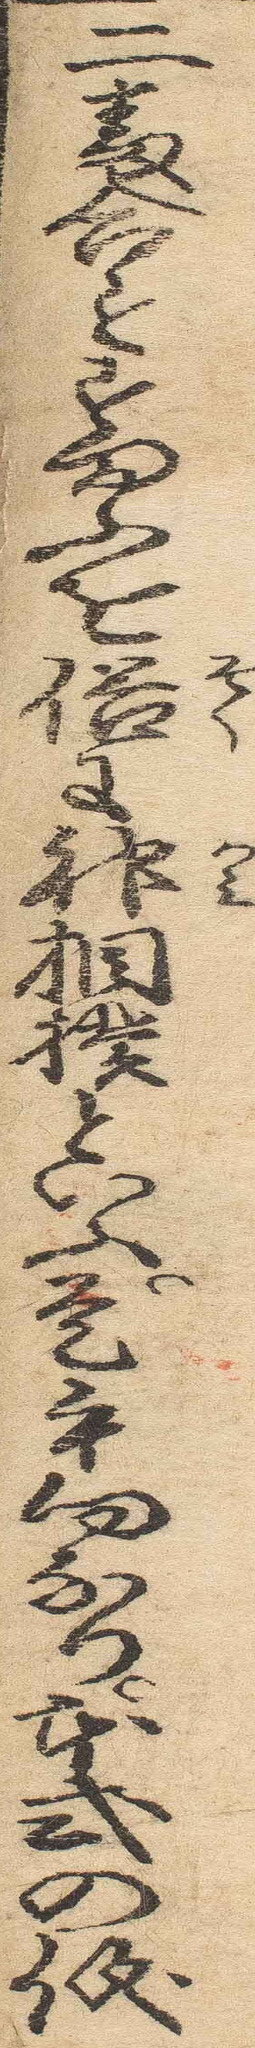二番合すすまふを俗に神相撲といふ。是手向なり。本式の儀。
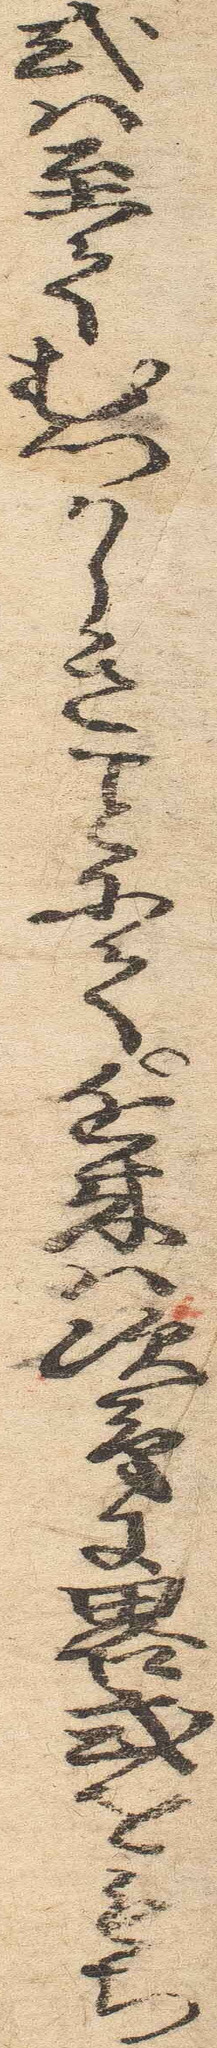式ハ至てむつかしきことにて近来ハ次第に畧式をもち
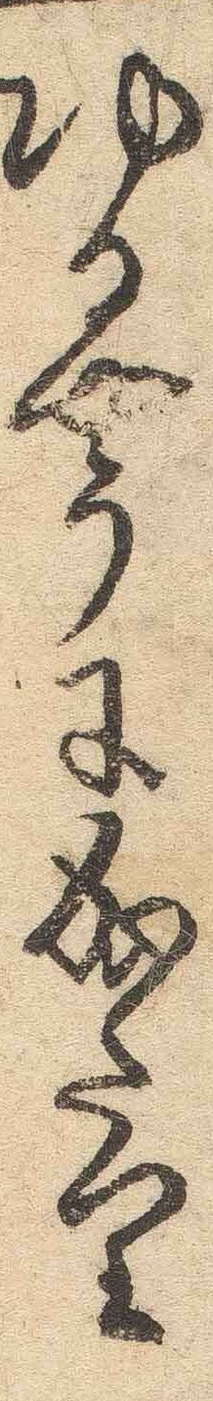ゆるやうに成たり
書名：古今相撲大全
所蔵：東京学芸大学附属図書館 国文学研究資料館
